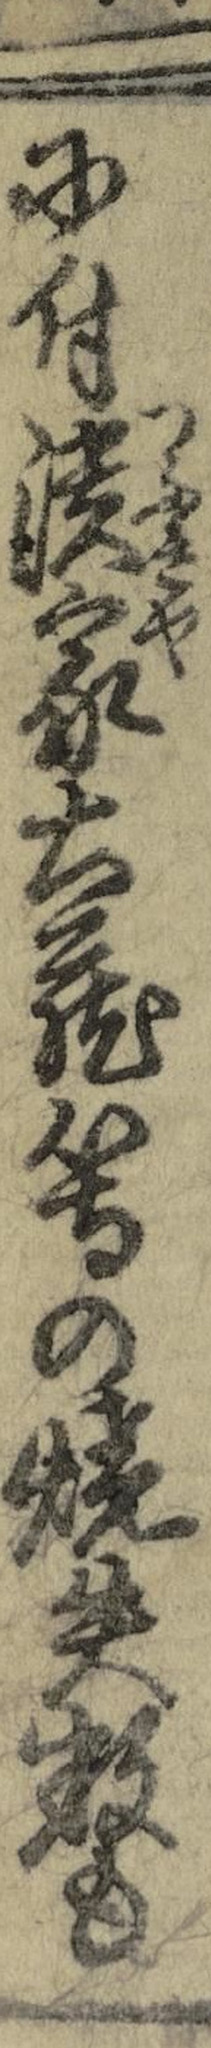に付潰家土蔵等の焼失数も
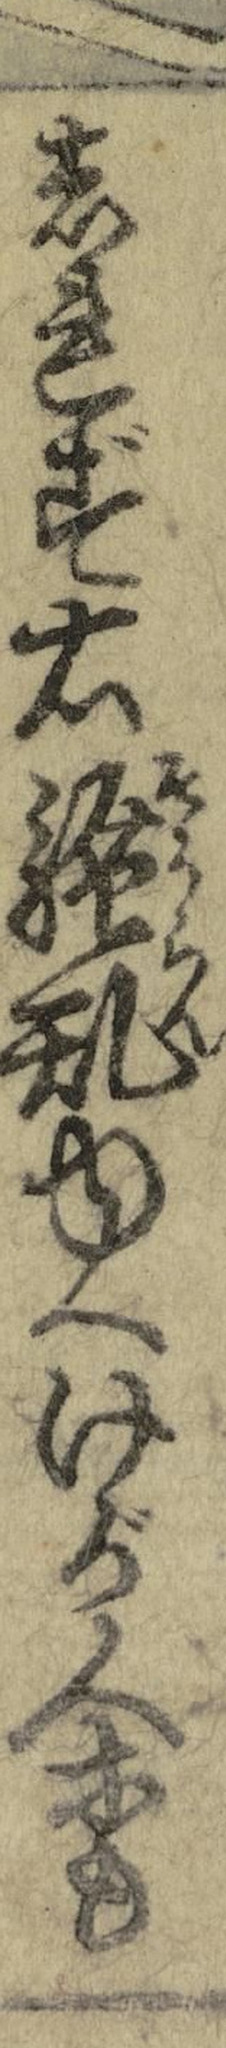しれず右騒乱ゆへけが人等も
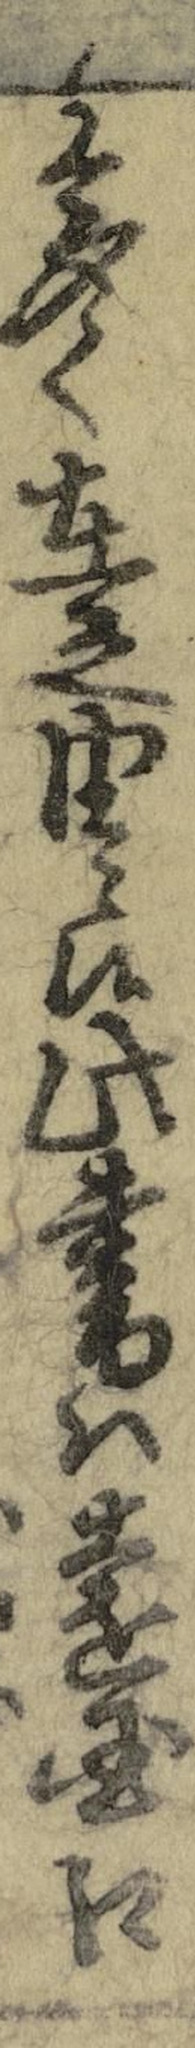多く在之由ニ候此書は遠国え
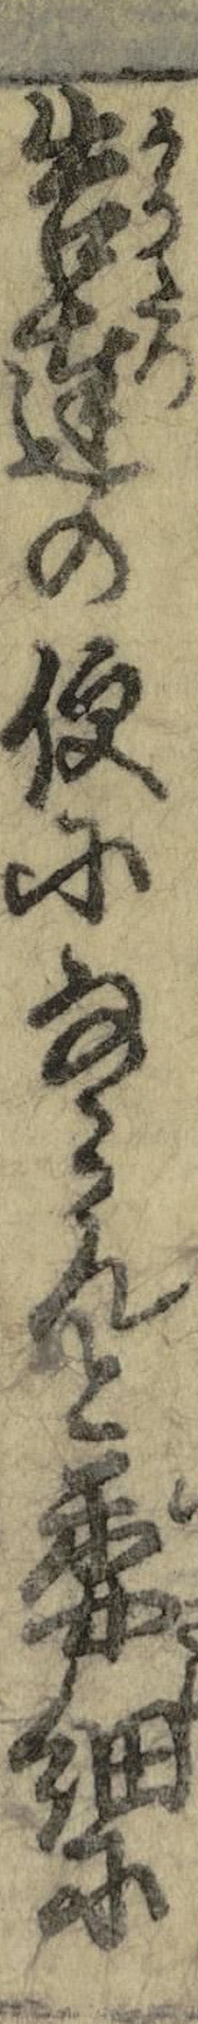告達の便にならんと委細に
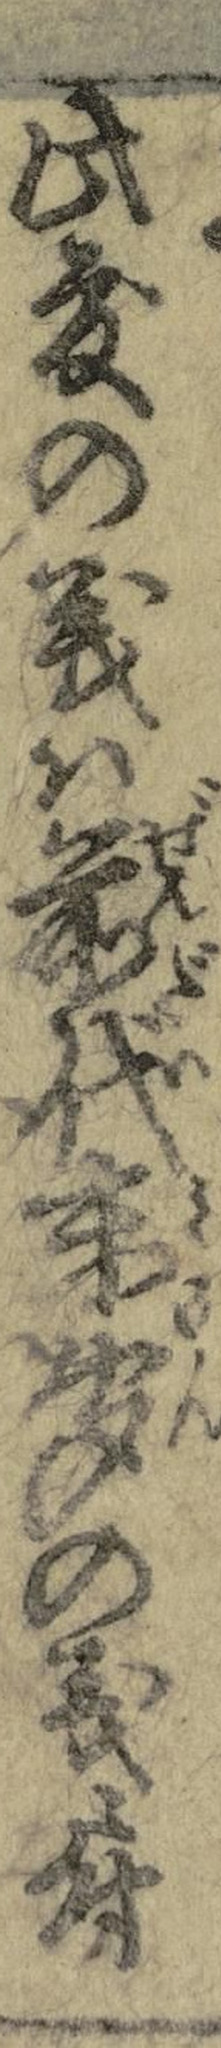此度の義は前代未聞の義ニ付
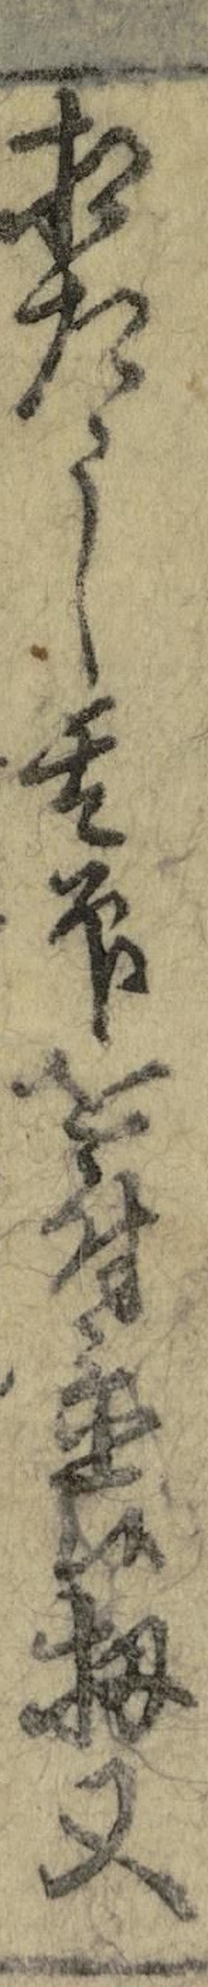相たゝし其印を付置候扨又
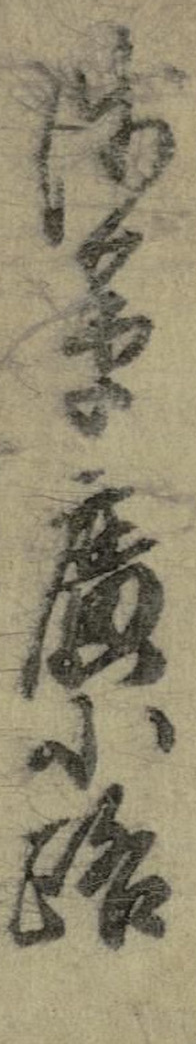浅草広小路
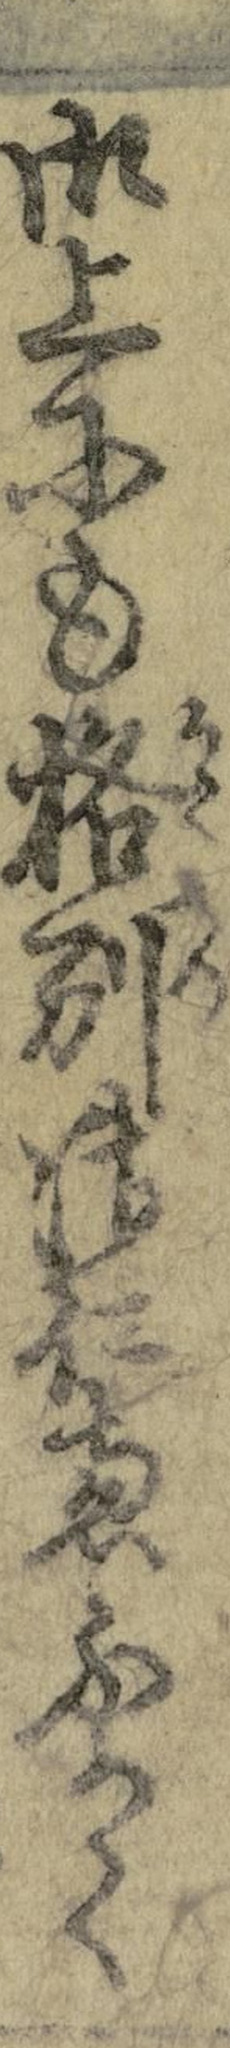御上にも格別御仁恵ふかく
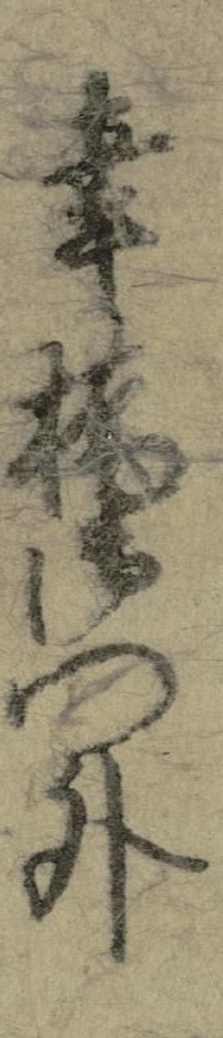幸橋御門外
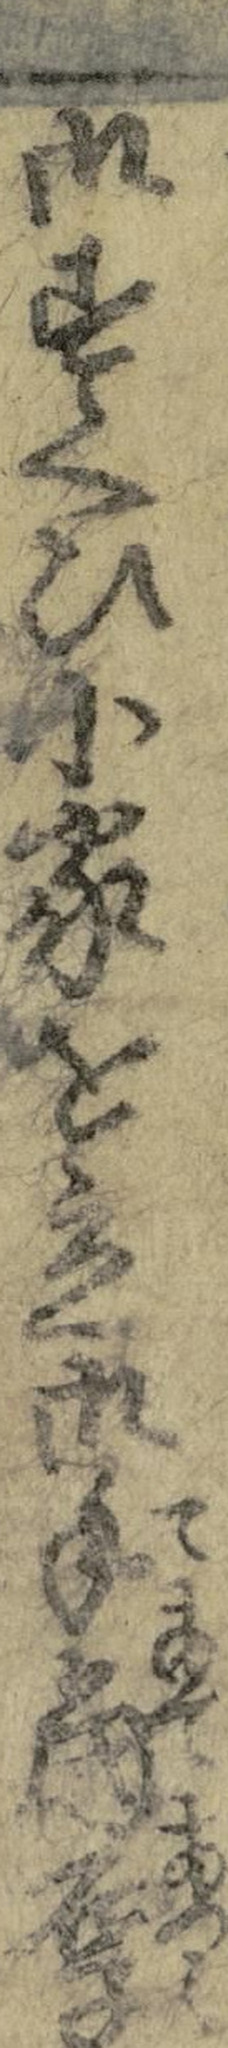御すくひ小家を立御手当厚
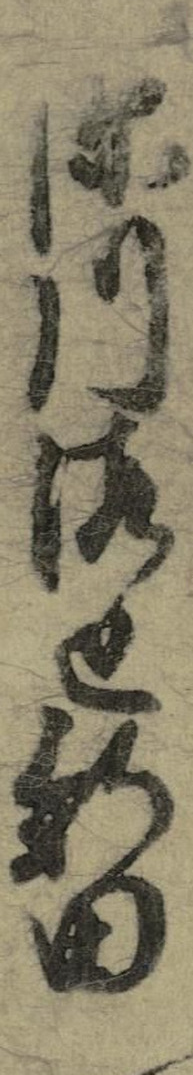深川海辺新田
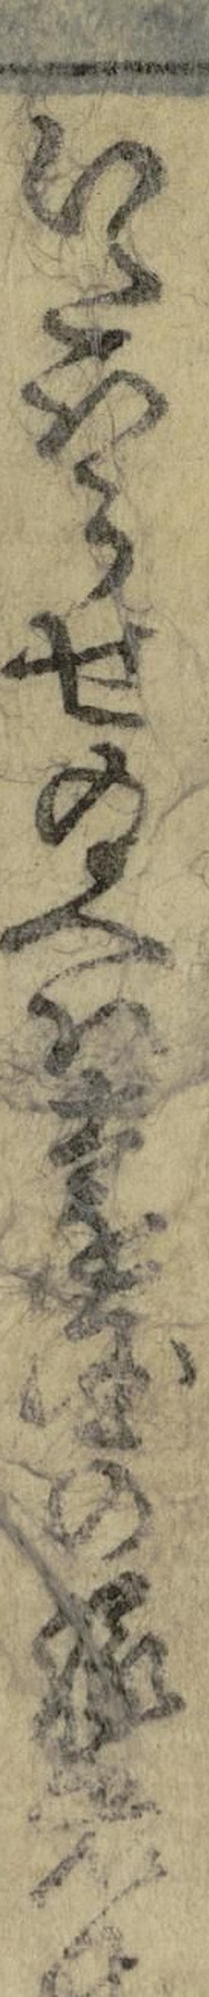いたはらせ給へは遠国の縁者に
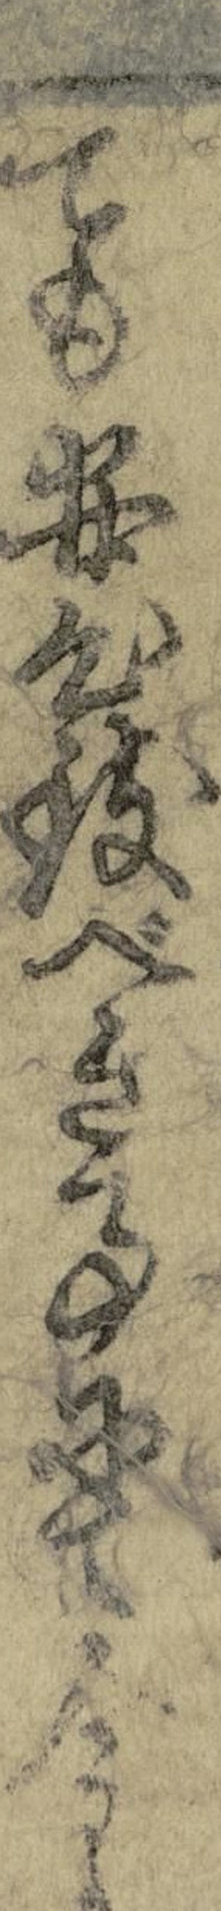ても安心致べき事にて今より
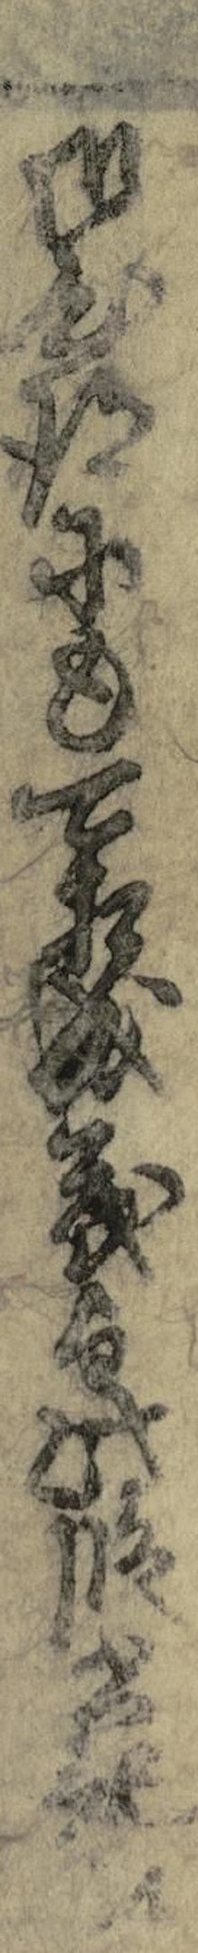御心得にも可相成義と此段書記候
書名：泰平震華鑒要
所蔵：東京大学地震研究所図書室 Earthquake Research Institute Library, The University of Tokyo, JAPAN
